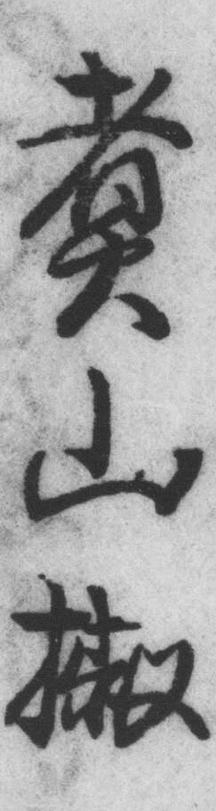煮山椒
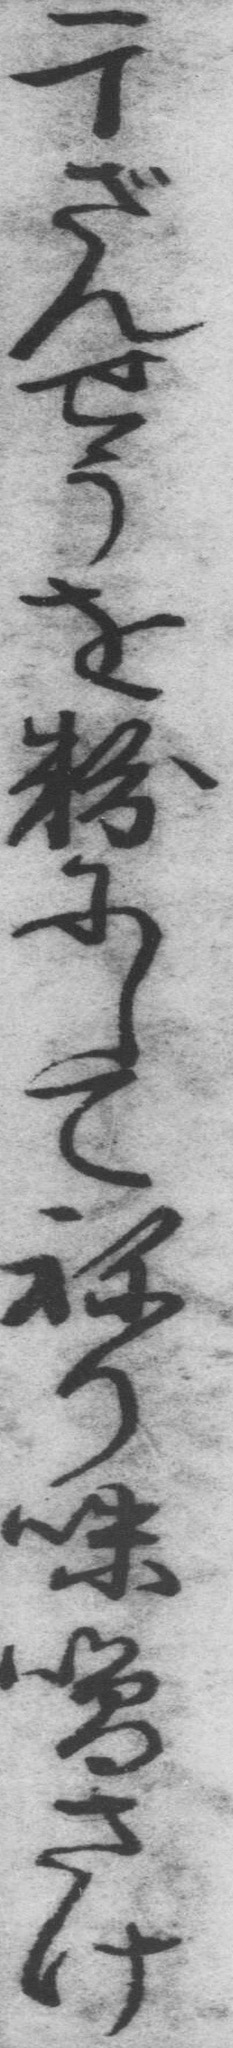干ざんせうを粉にしてねり味噌さけ

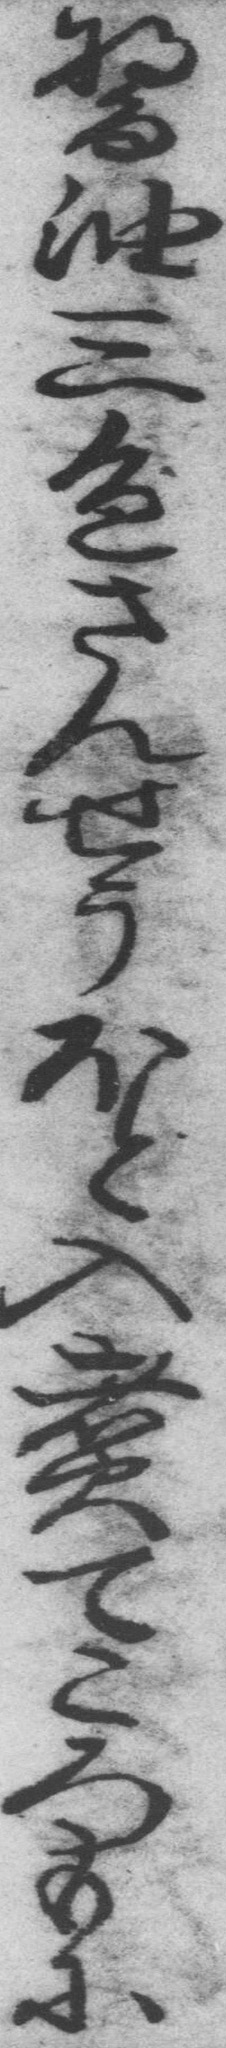醤油三色さんせうほと入煮てころもに
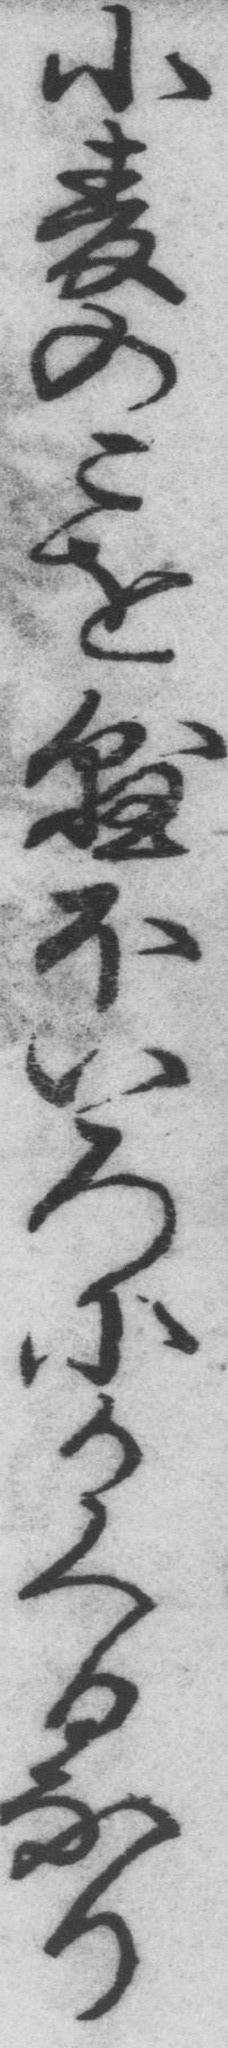小麦のこを懸ほいろにかへるなり
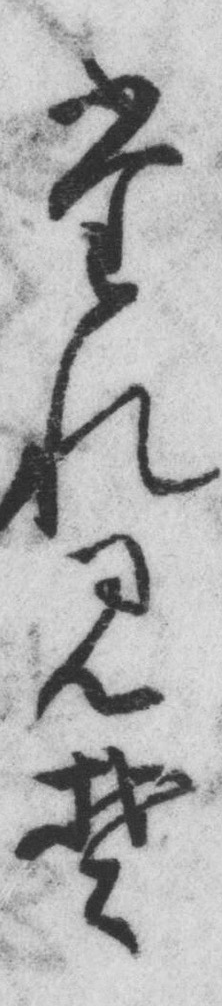たれみそ
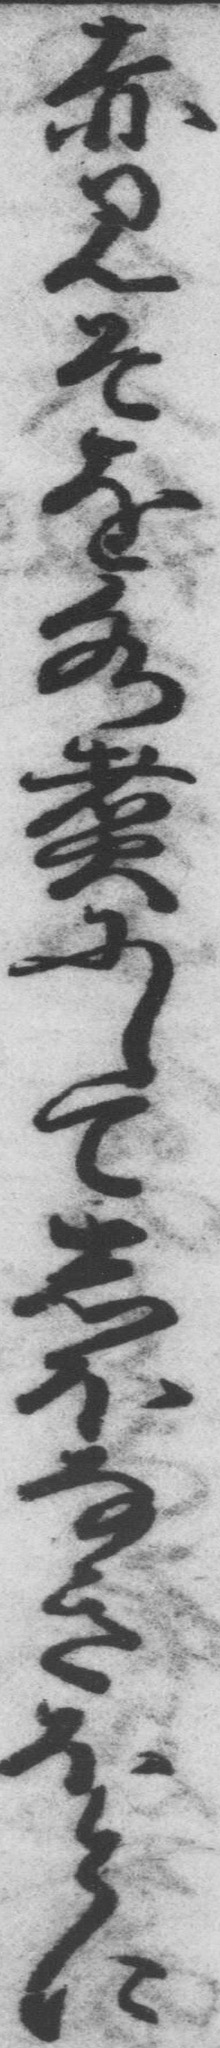赤みそを水煮にしてしほなきほとに
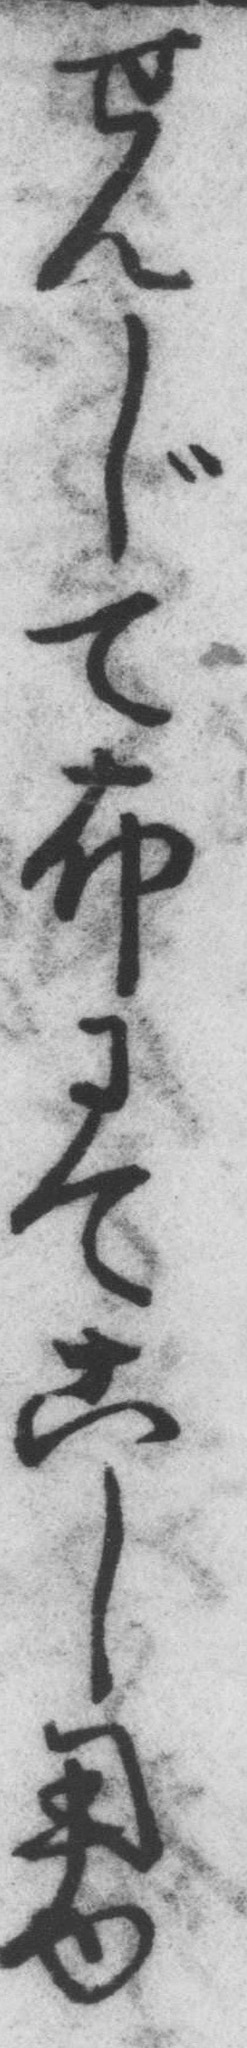せんじて布にてこし用ゆ
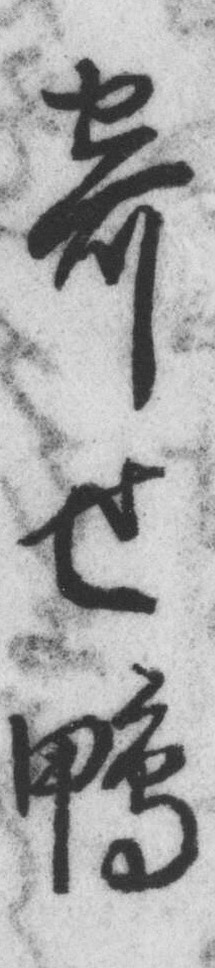寄せ鴨
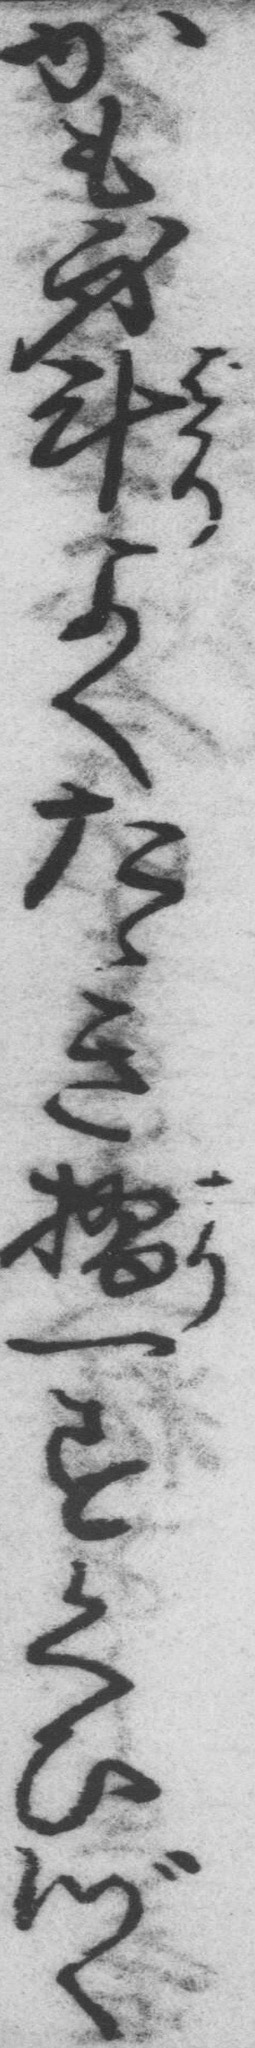かも身斗よくたゝき摺一すくひづゝ
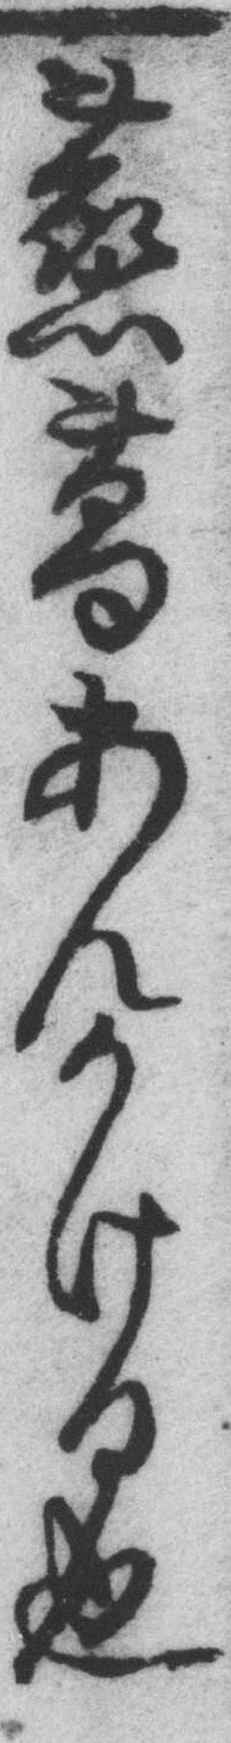蒸葛あんかける也
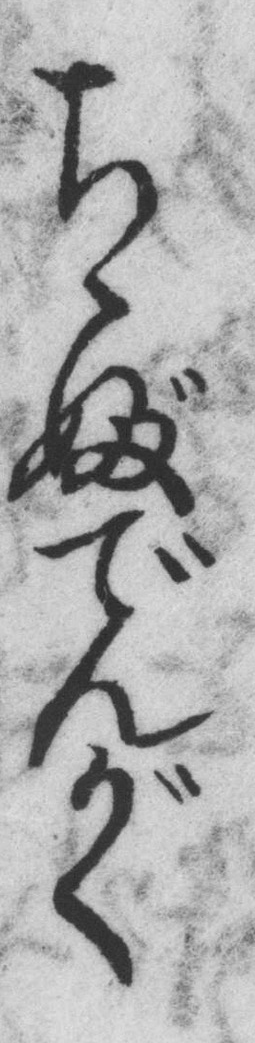ちゝぶでんがく
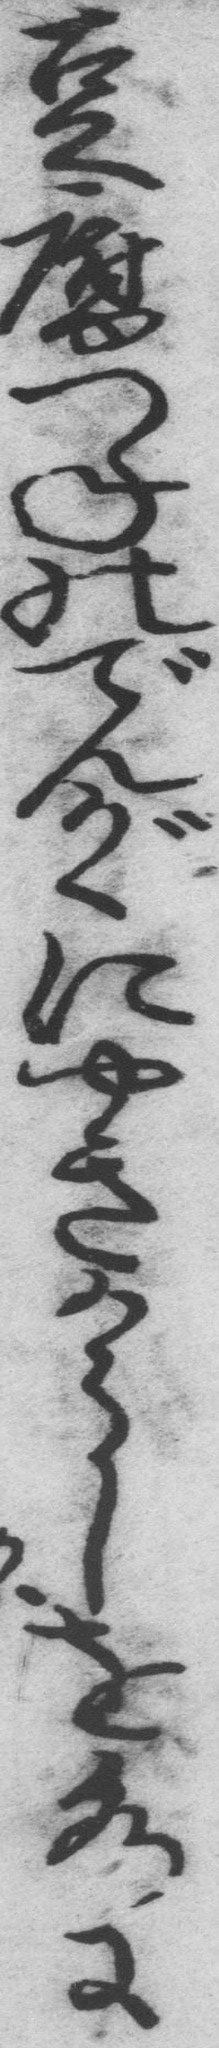豆腐つねのでんがくにやきからしを水に
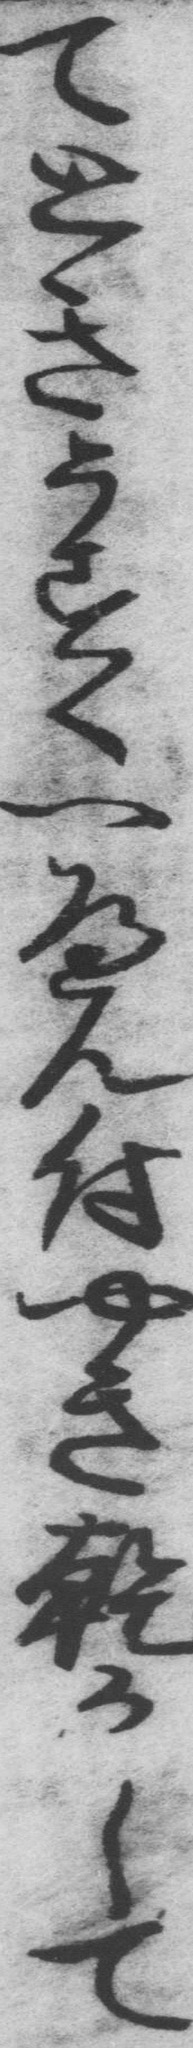てときうすく一へん付やき乾かして
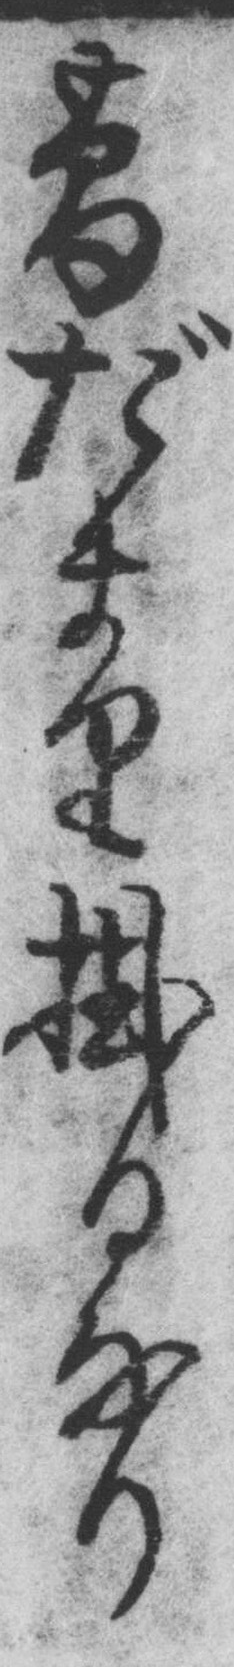葛だまり掛るなり
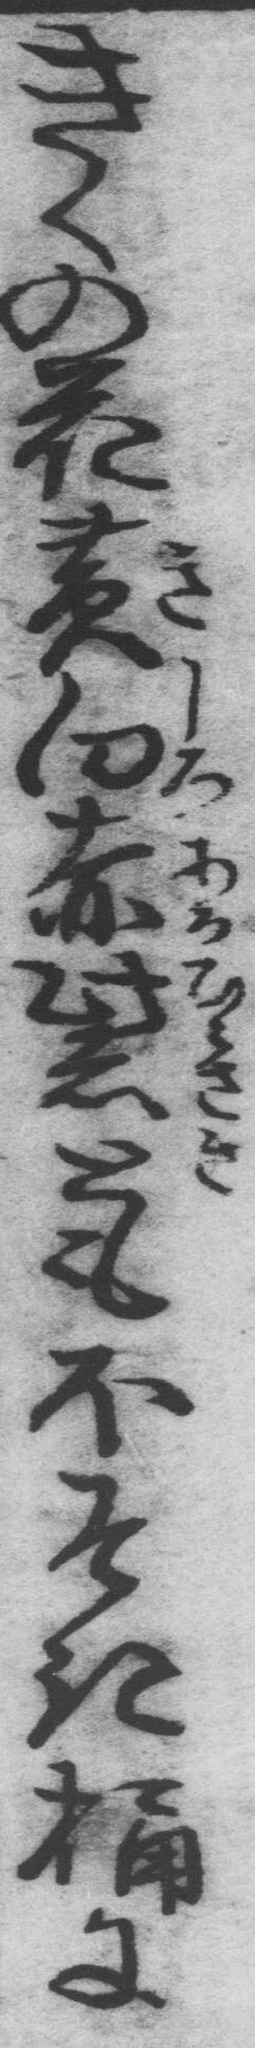きくの花黄白赤紫ともほそき桶に

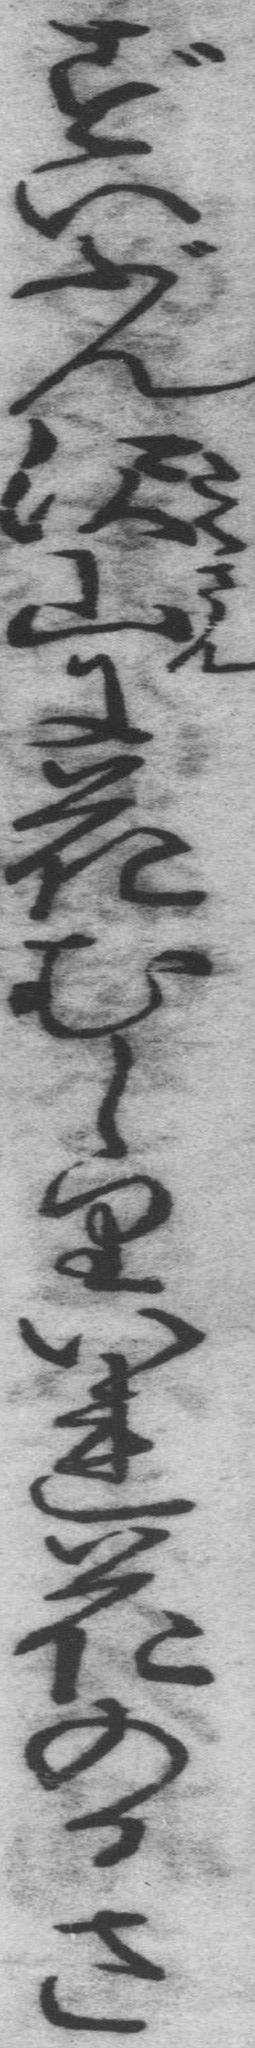ずいぶん沢山に花むしりいれ花のかさ
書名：料理山海郷
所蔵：大阪府立大学学術情報センター 国文学研究資料館
